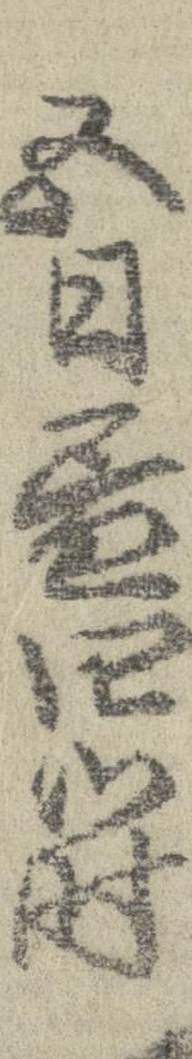五日昼四ツ時
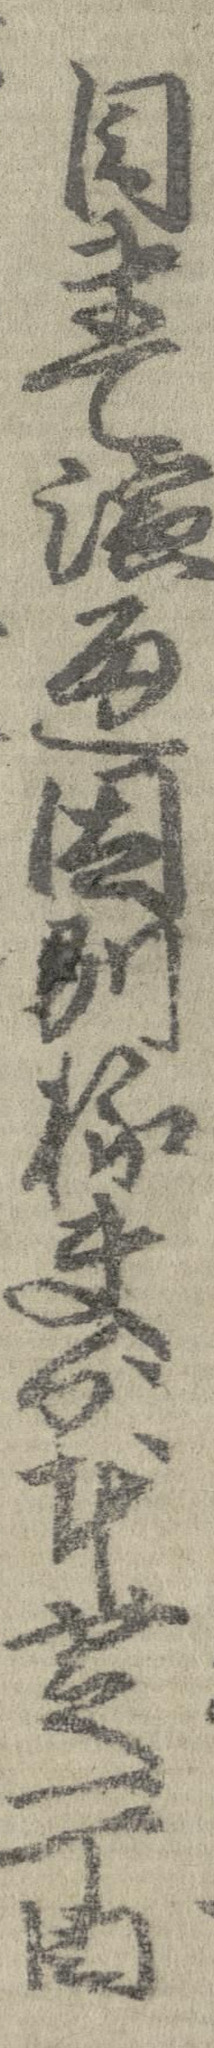目まて濱通因州様夫ゟ本芝一丁目
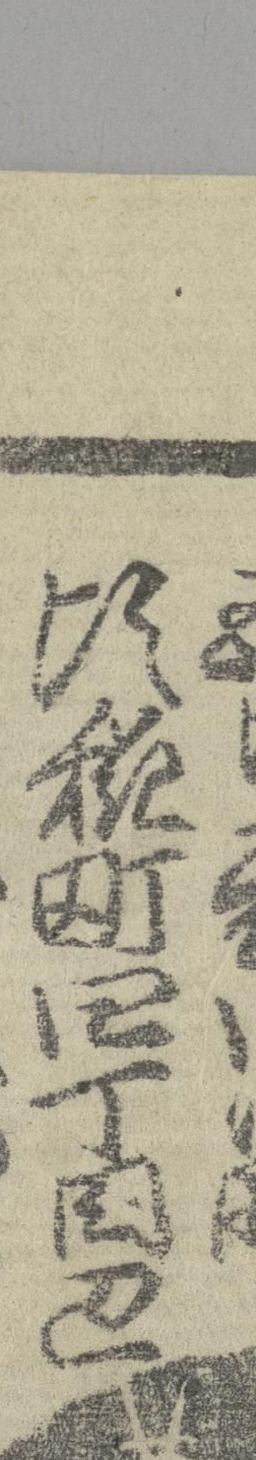頃糀町四丁目辺
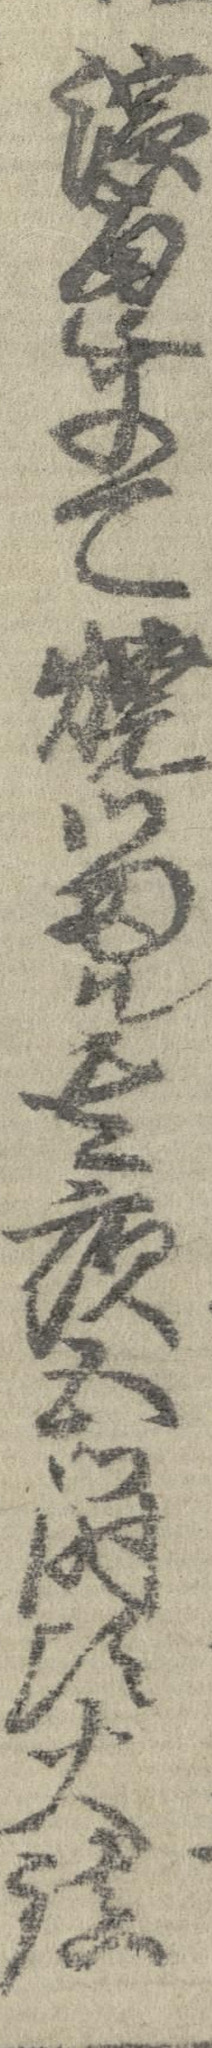濱通にて焼留ル其夜五ツ時頃火鎮
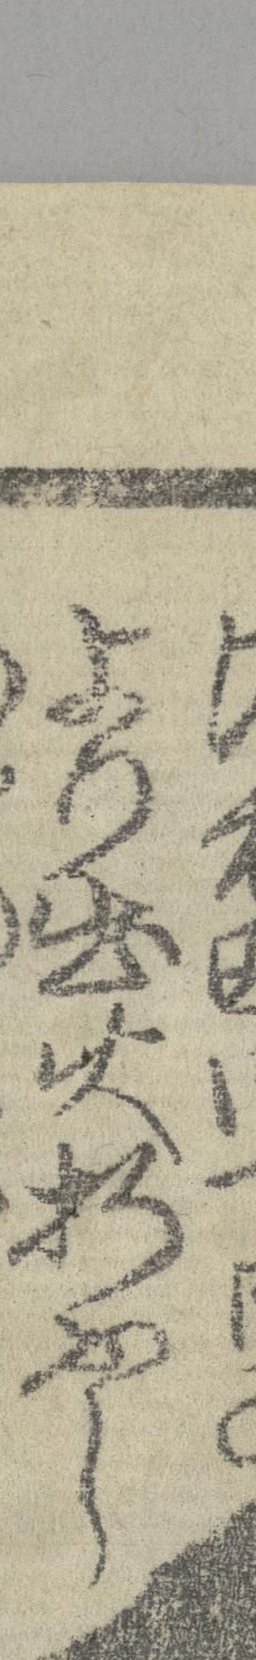より出火折ふし
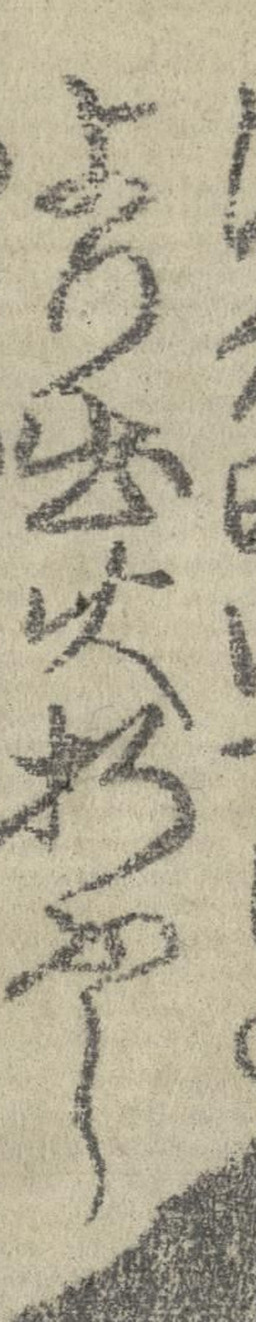より出火折ふし
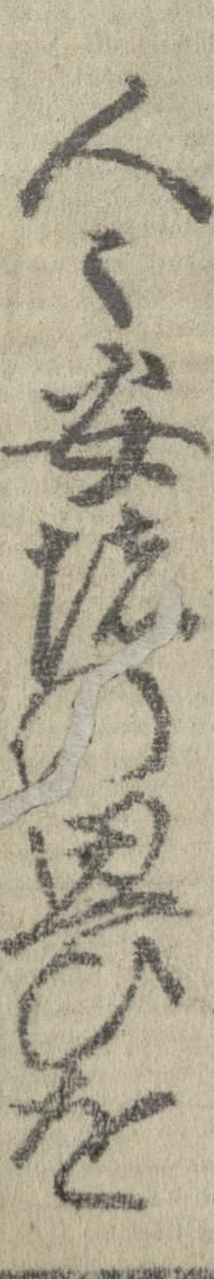人々安堵の思ひを
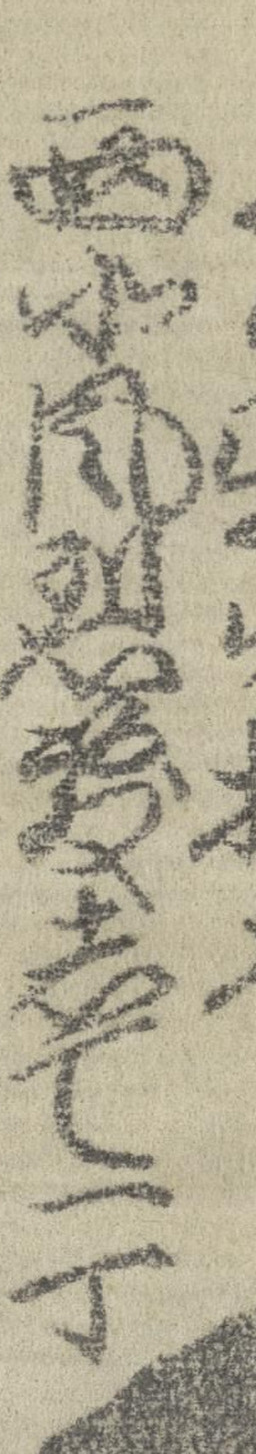西北風烈敷して一丁
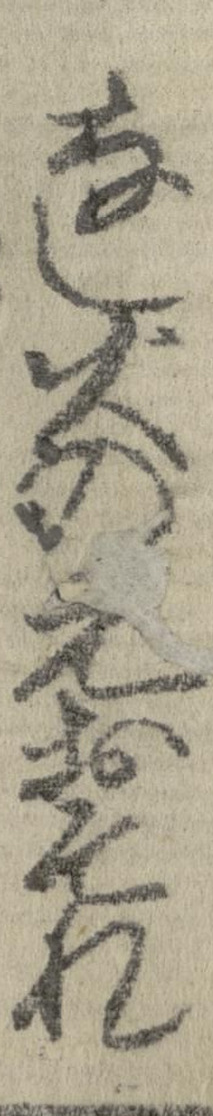なし火の元おそれ
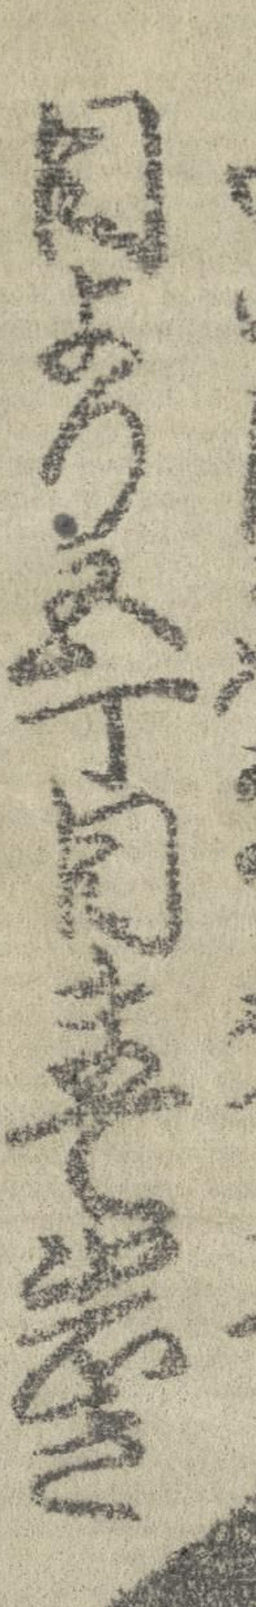目より五丁目まて岩き
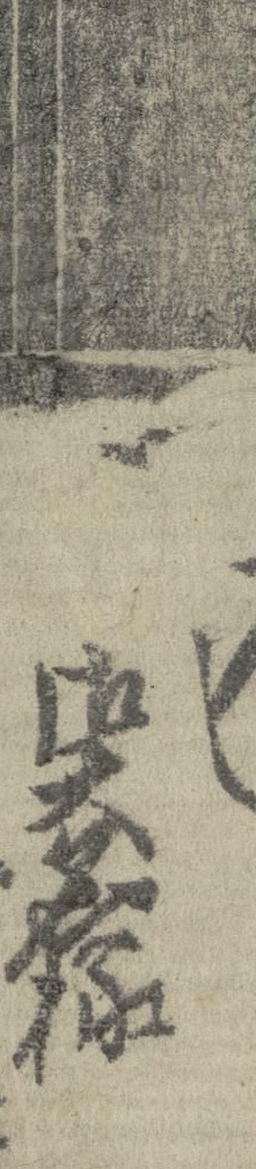御大名様
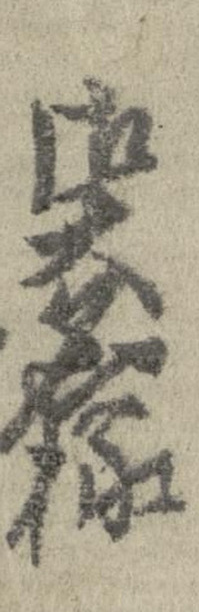御大名様
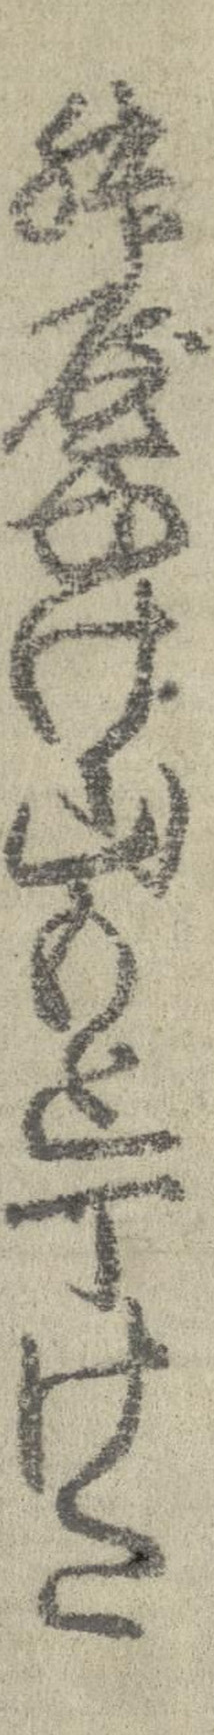綿屋やけ山もと丁けた
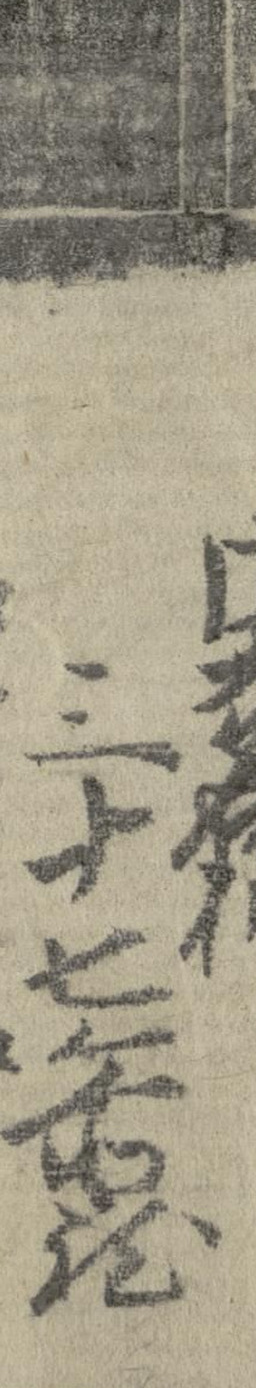三十七ケ所程
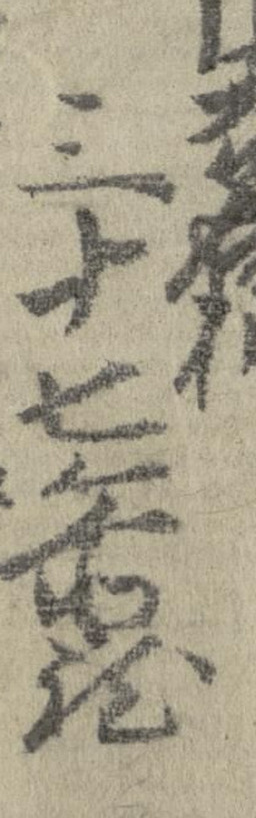三十七ケ所程
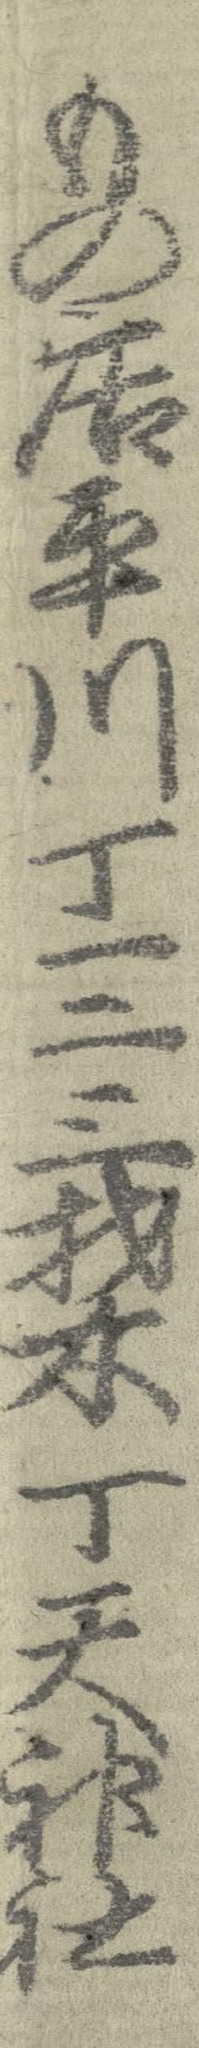もの店平川丁一二三材木丁天神社
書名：[嘉永三年二月の江戸大火に関する瓦版]
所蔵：東京大学地震研究所図書室 Earthquake Research Institute Library, The University of Tokyo, JAPAN
